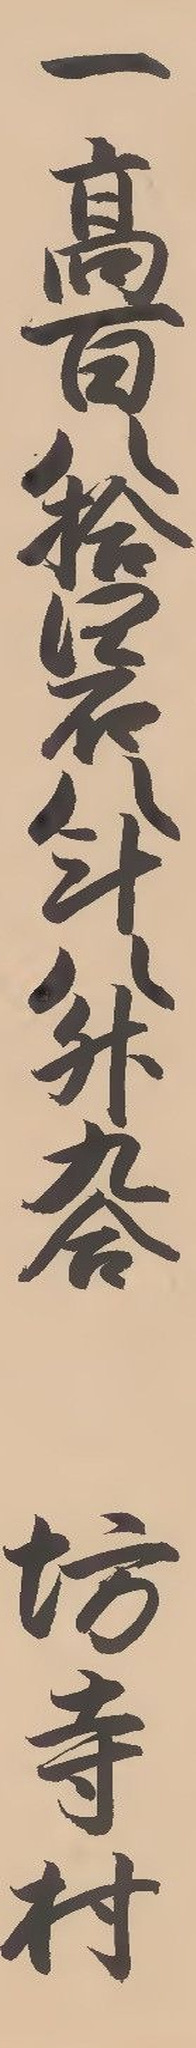一高百八拾四石八斗八升九合坊寺村
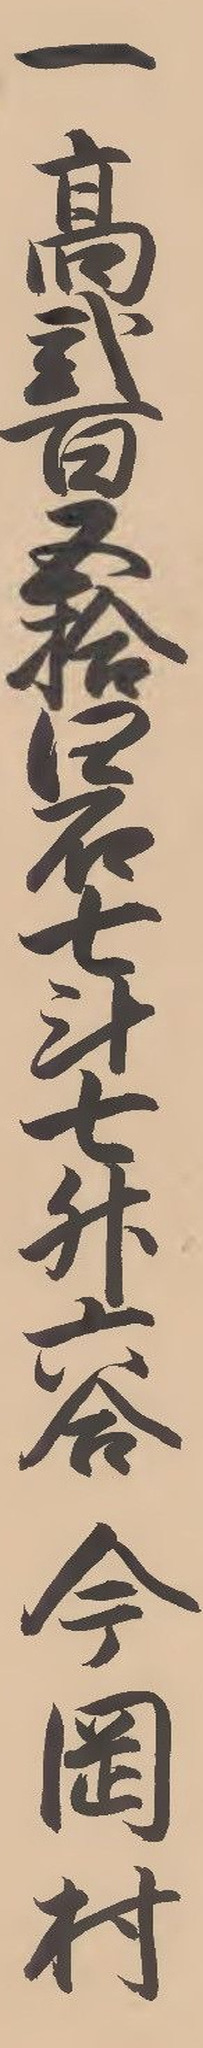一高弐百五拾四石七斗七升六合今岡村
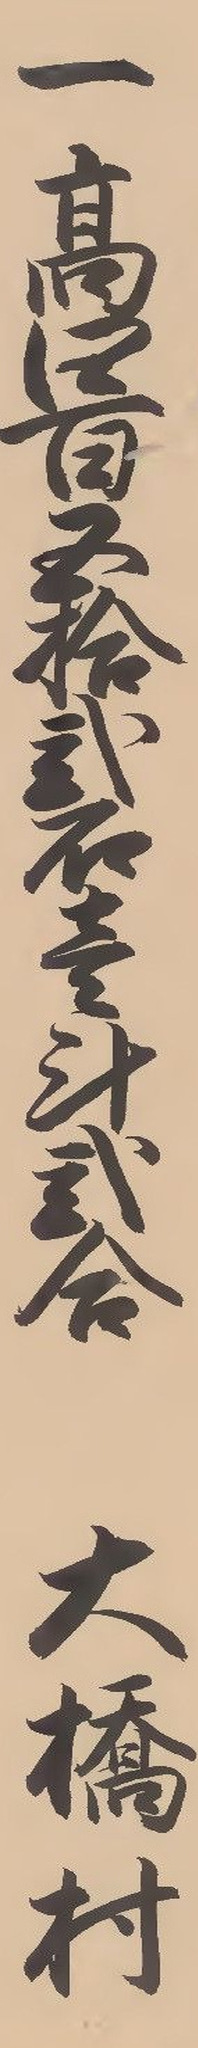一高四百五拾弐石壱斗弐合大橋村
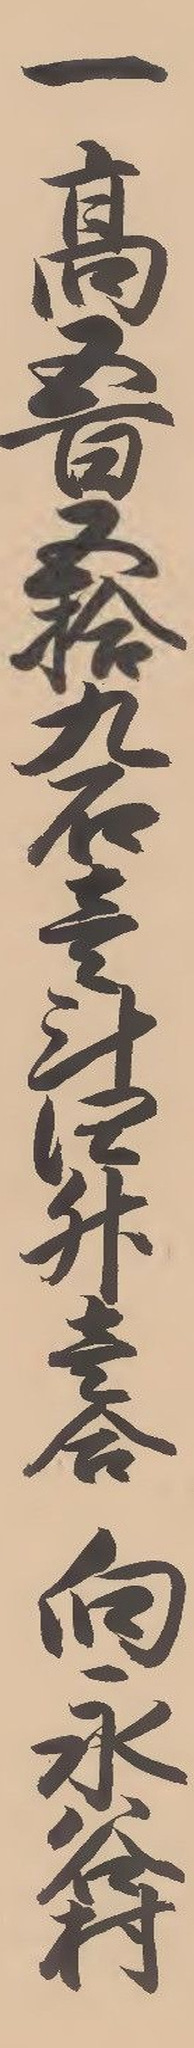一高五百五拾九石壱斗四升壱合向永谷村
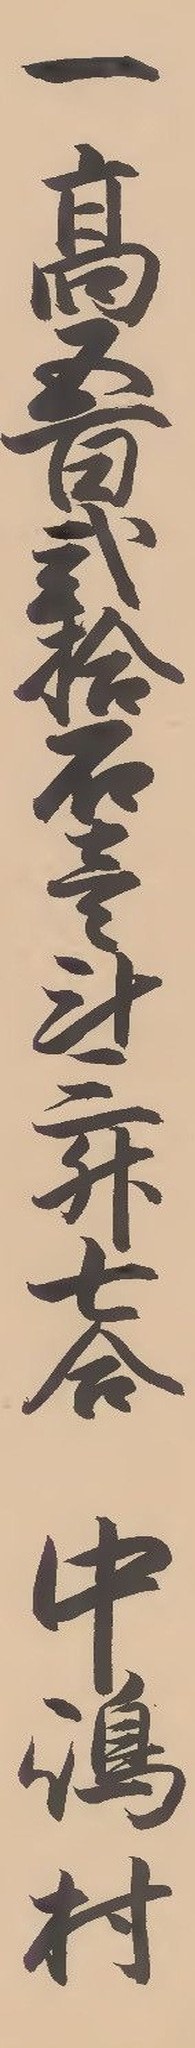一高五百弐拾石壱斗三升七合中島村

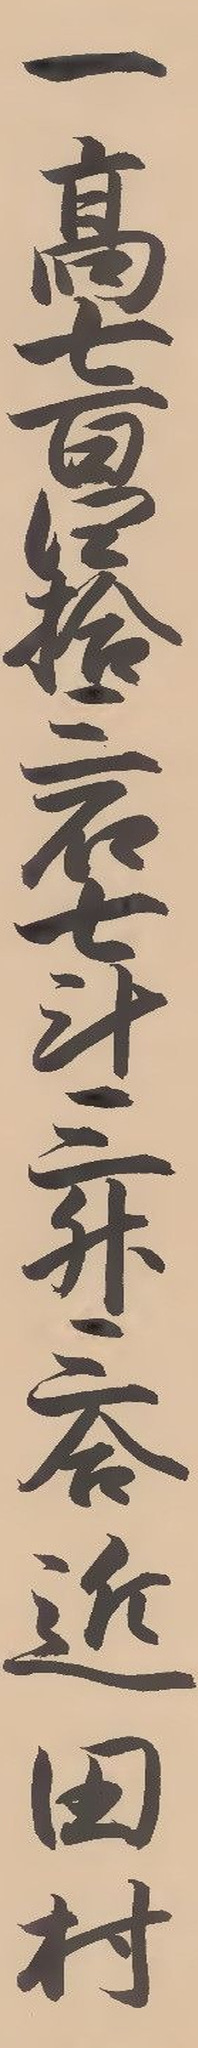一高七百四拾三石七斗三升三合近田村
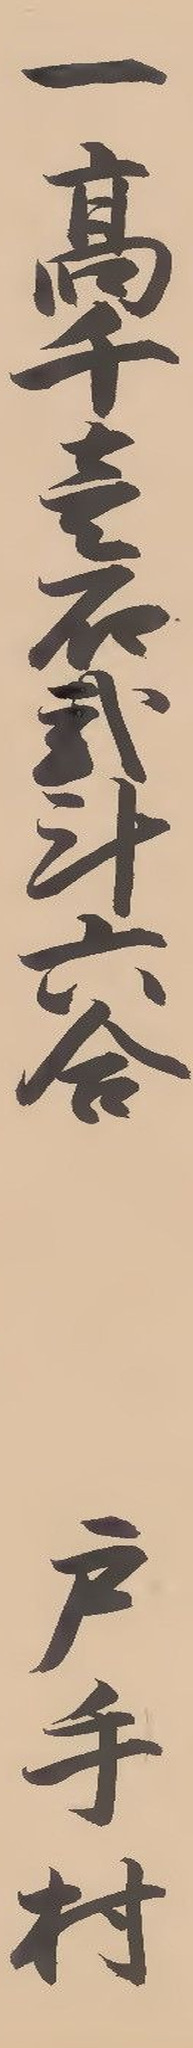一高千壱石弐斗六合戸手村
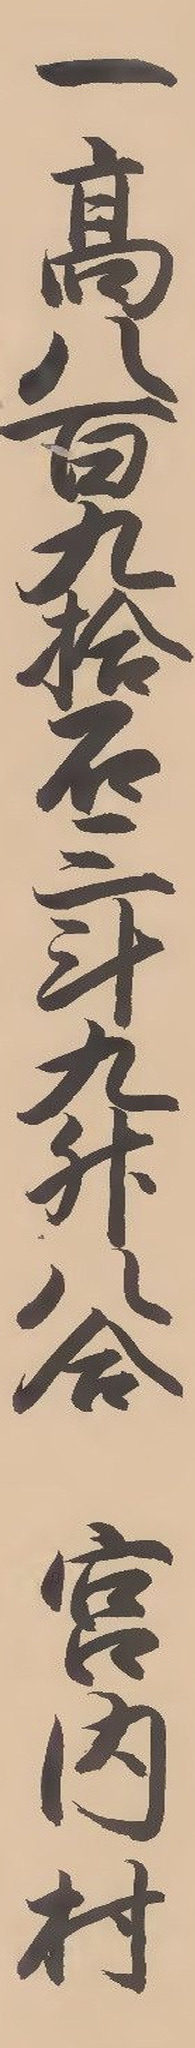一高八百九拾石三斗九升八合宮内村
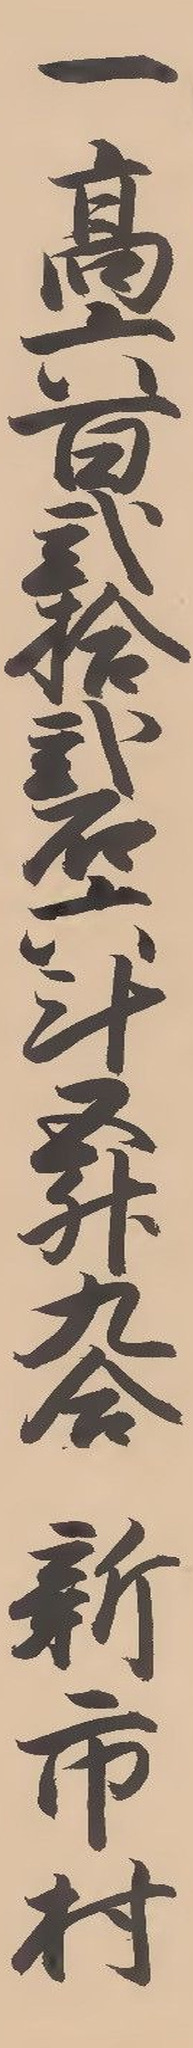一高六百弐拾弐石六斗五升九合新市村
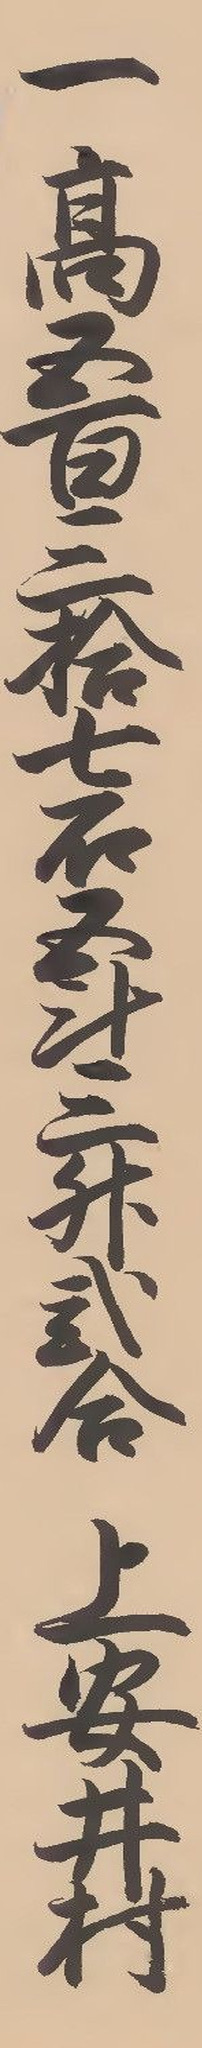一高五百三拾七石五斗三升弐合上安井村
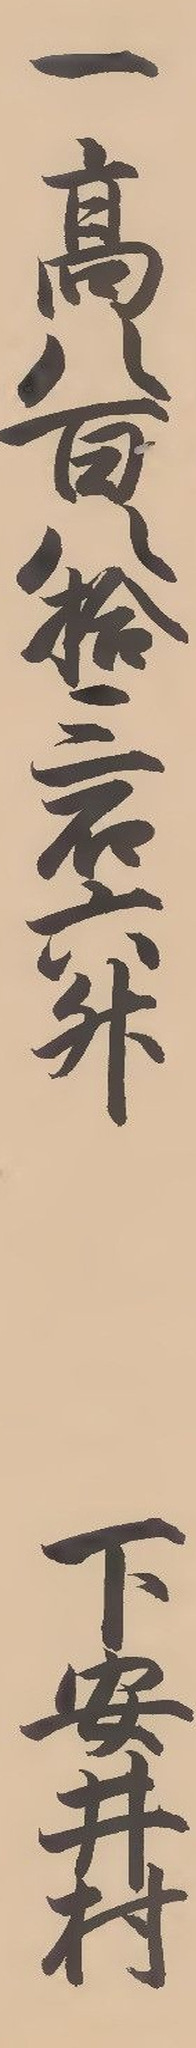一高八百八拾三石六升下安井村
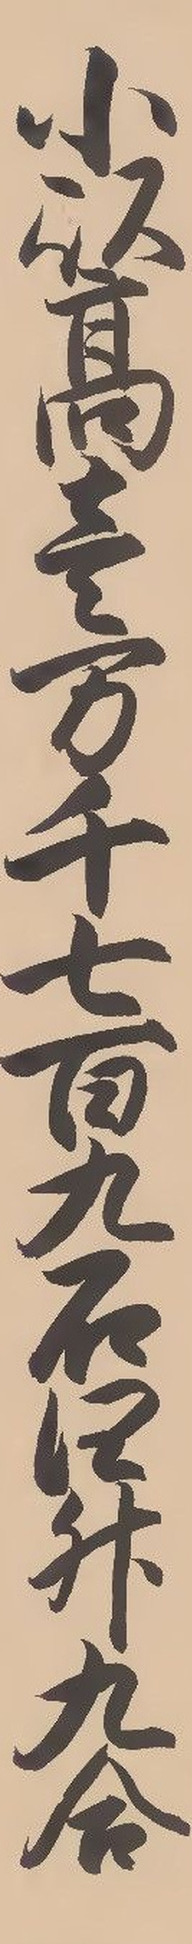小以高壱万千七百九石四升九合

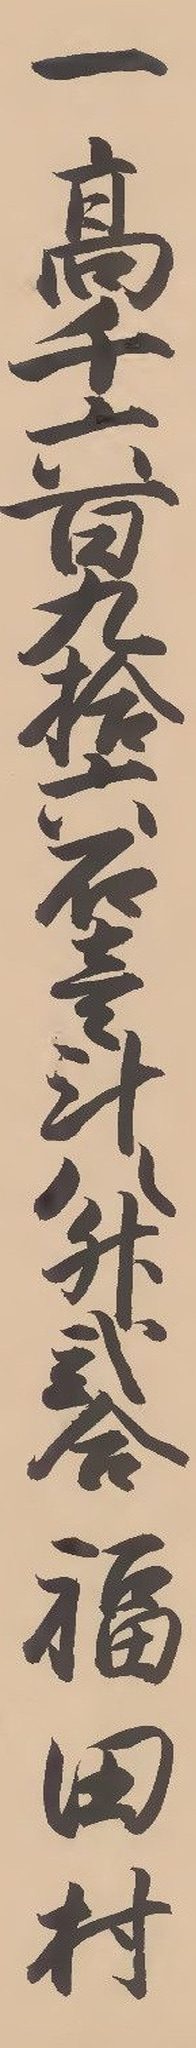一高千六百九拾六石壱斗八升弐合福田村
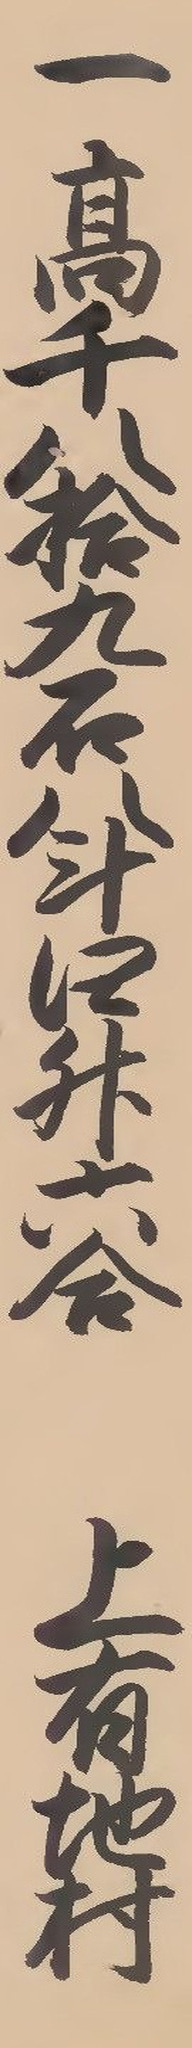一高千八拾九石八斗四升六合上有地村
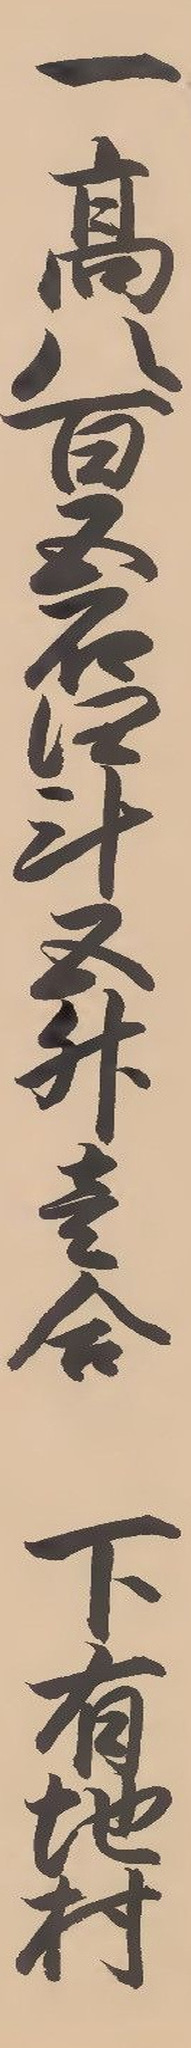一高八百五石四斗五升壱合下有地村
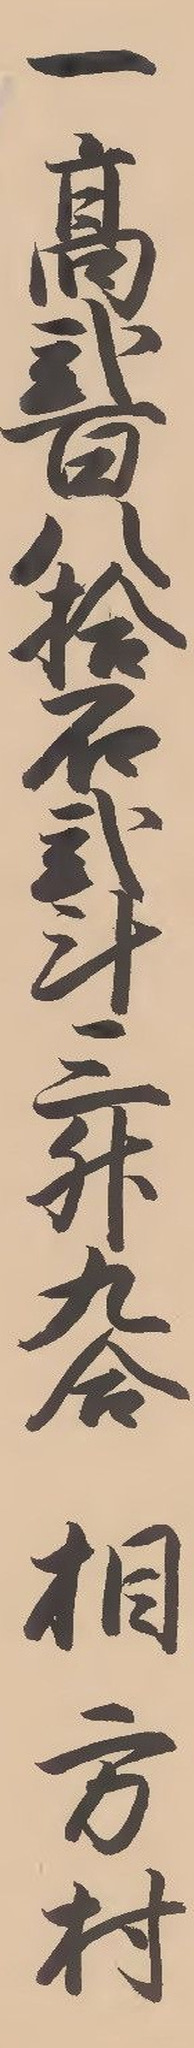一高弐百八拾石弐斗三升九合相方村
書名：備後国郷帳
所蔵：国立公文書館 National Archives of Japan
